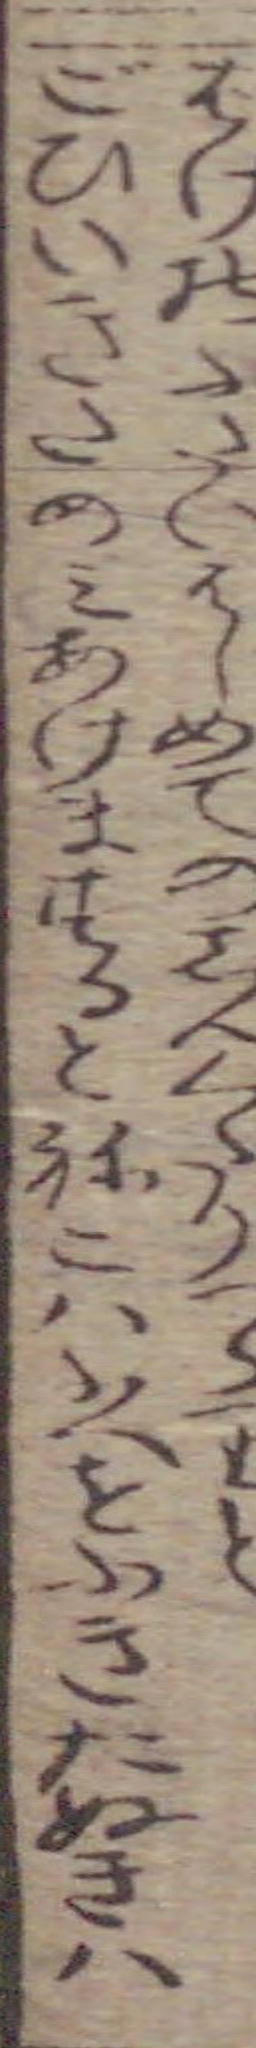ごひいきたのみあけまするとねこはふへをふきたぬきは
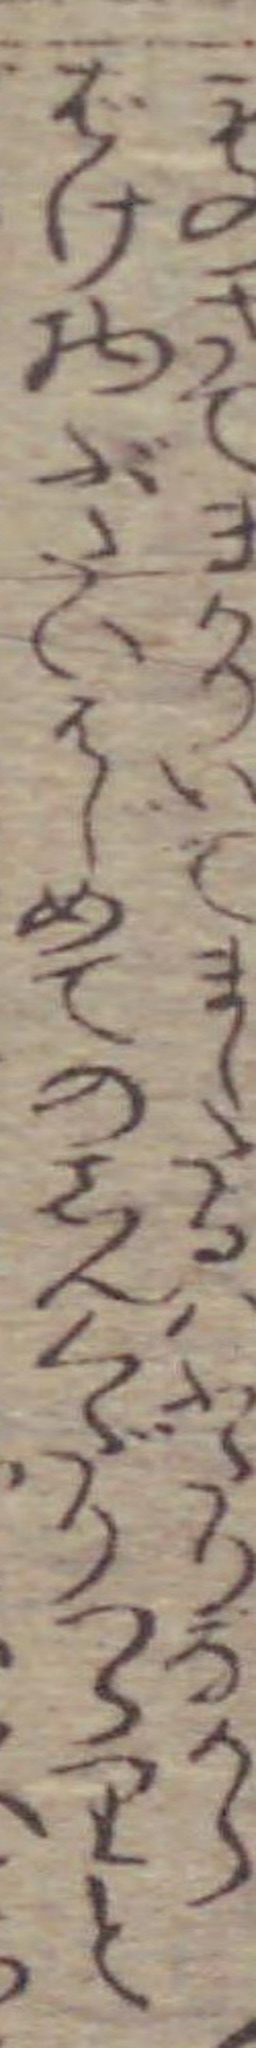ばけ物ぶたいはしめてのしんくだりつらりと
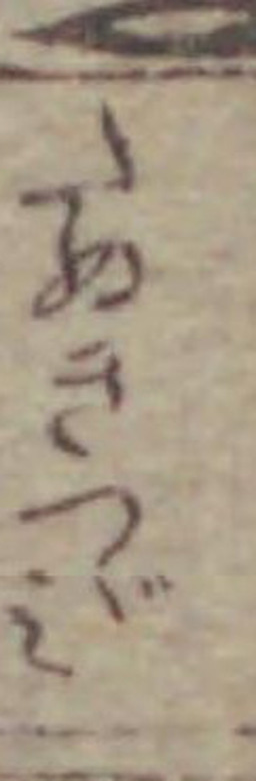たぬきつゞみ
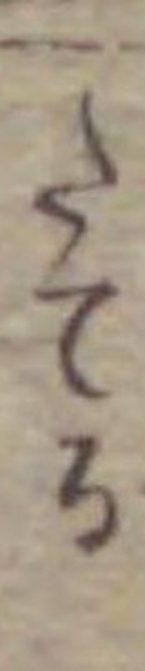たてる
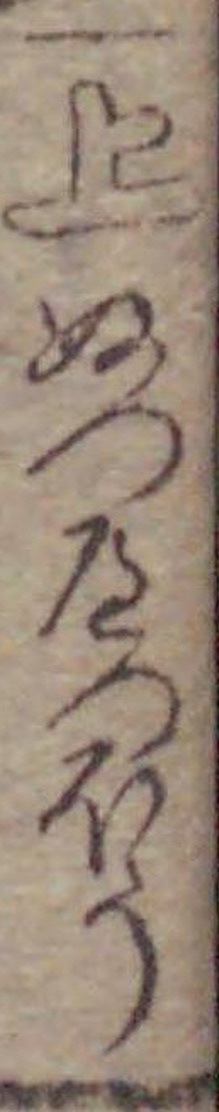上ぬつへつほう
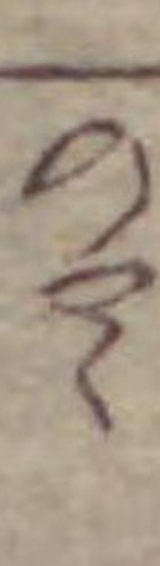のやく
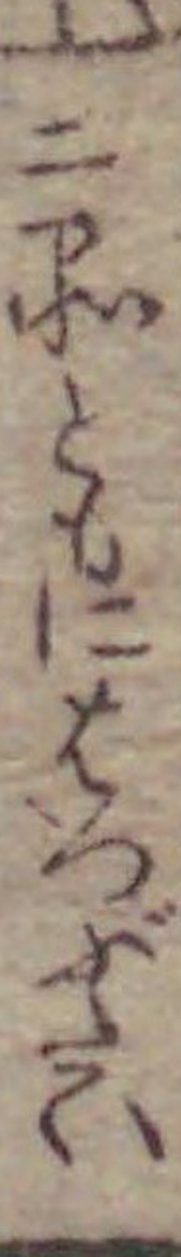二品ともにはつぶたい
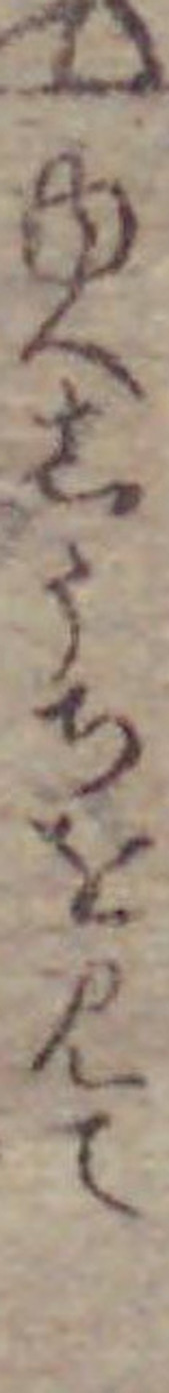ゆへしうちをみて
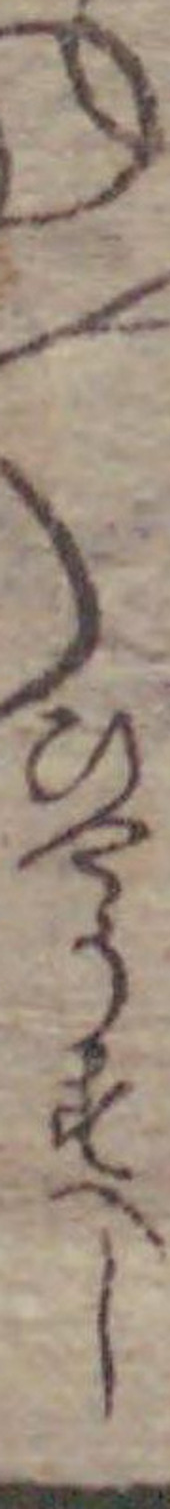ひやうすへし
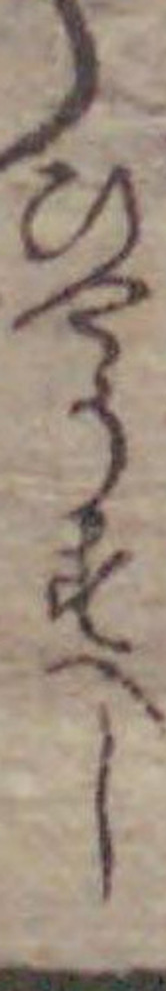ひやうすへし
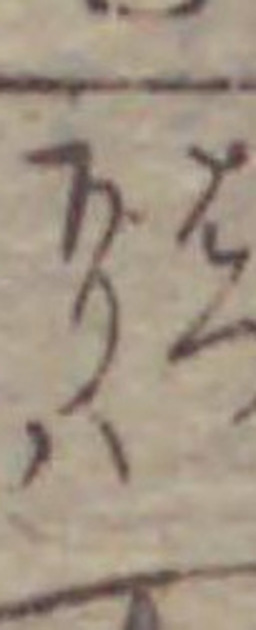下りは
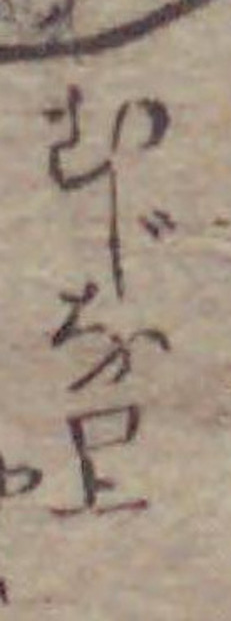むじな口上
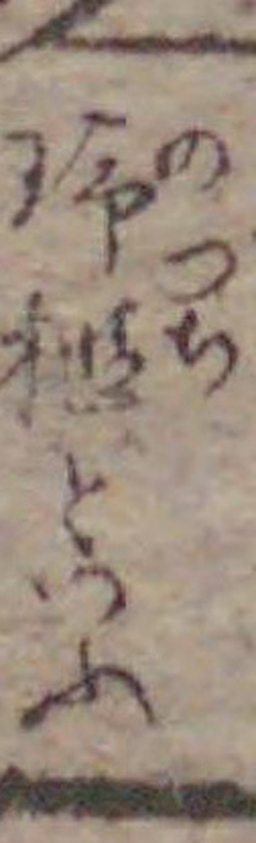珍槌といふ
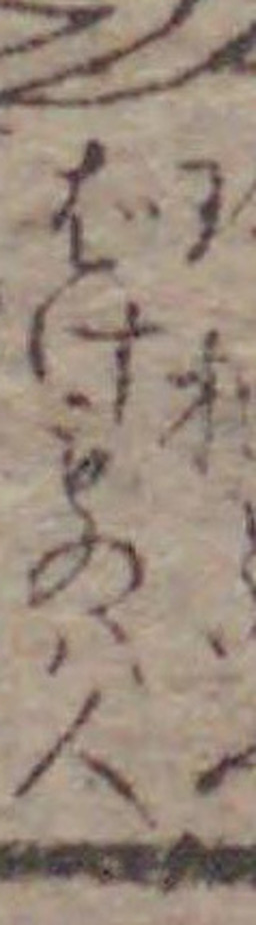ばけものは人
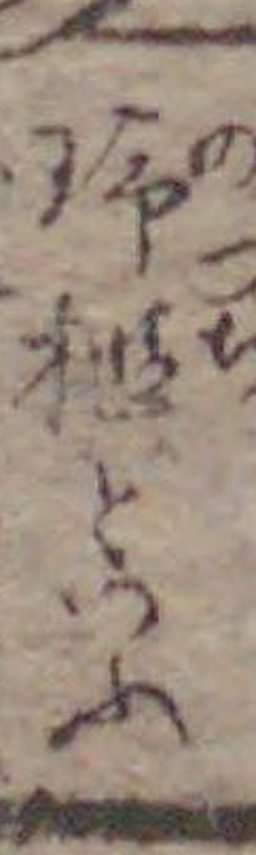珍槌といふ
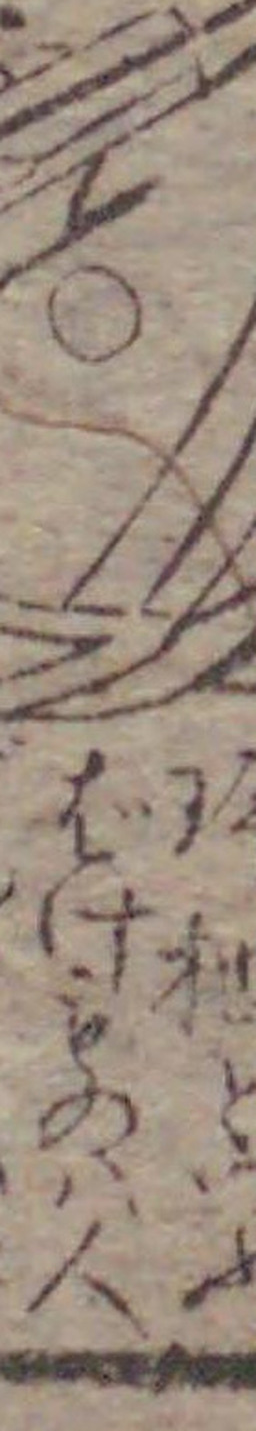ばけものは人
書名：妖怪仕内評判記 : 2巻
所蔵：国立国会図書館 National Diet Library, JAPAN
